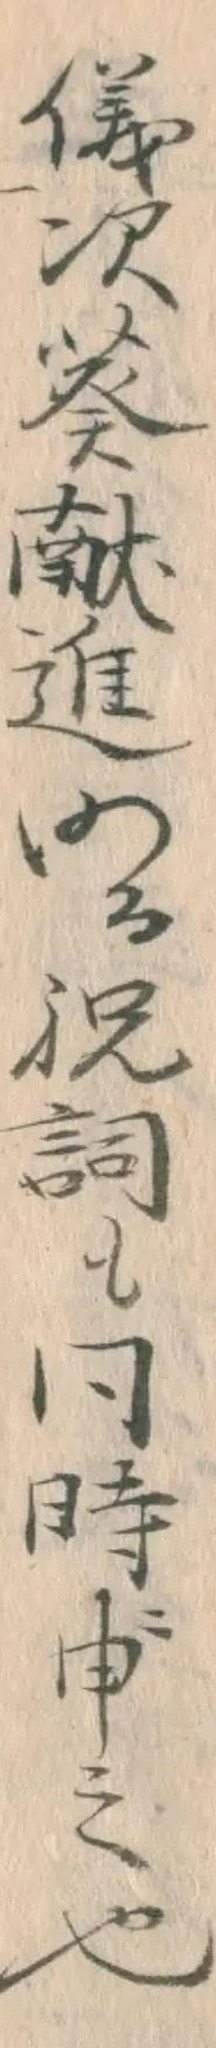儀次葵献進仍而祝詞も同時ニ申之也
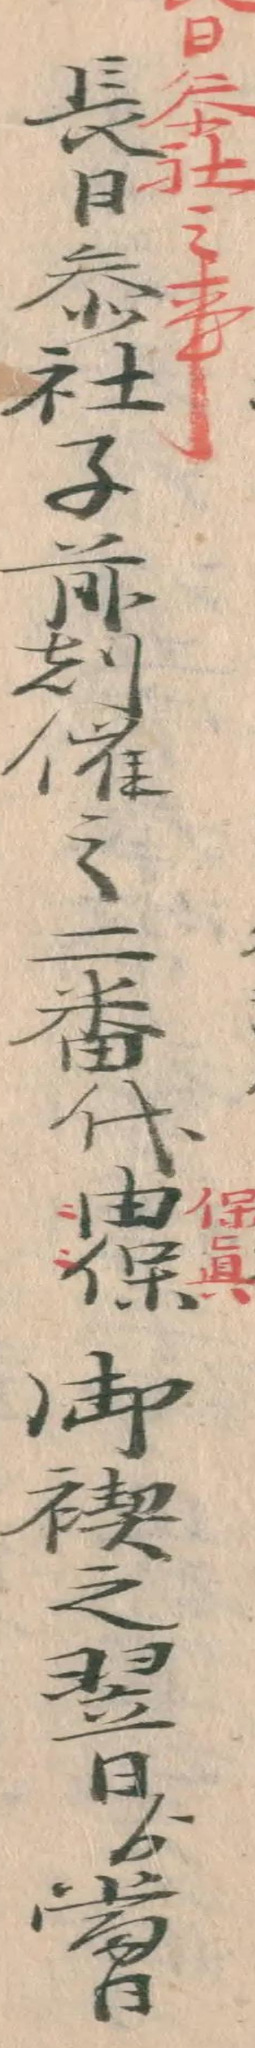一長日参社子前刻催之二番代由保御禊之翌日ゟ當日
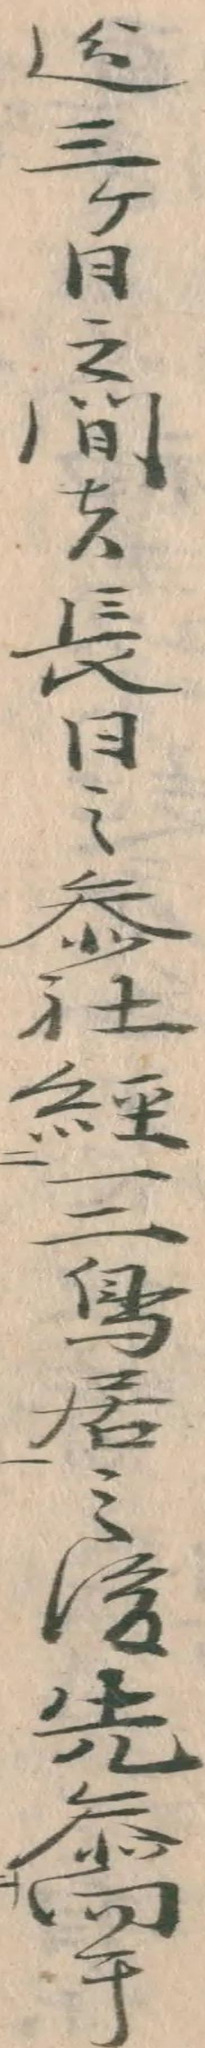迄三ヶ日之間は長日之参社経一二鳥居之後先参向于
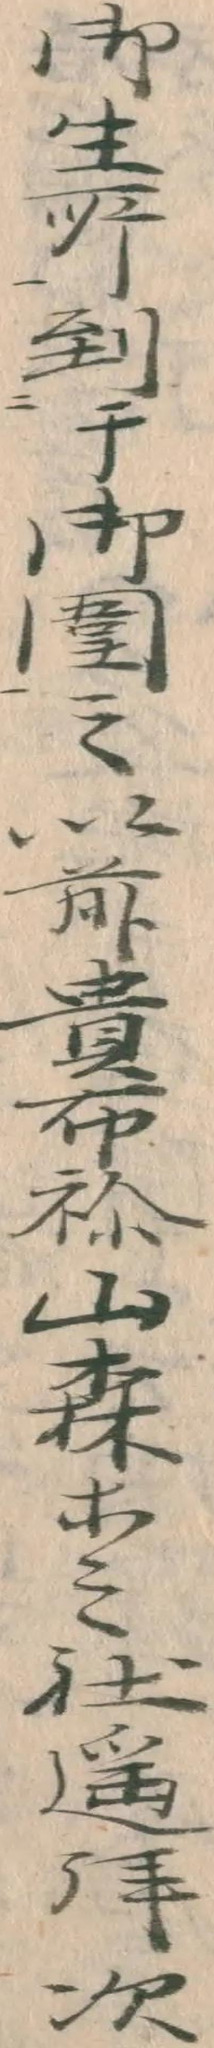御生所到于御圍之以前貴布祢山森等之社遥拝次
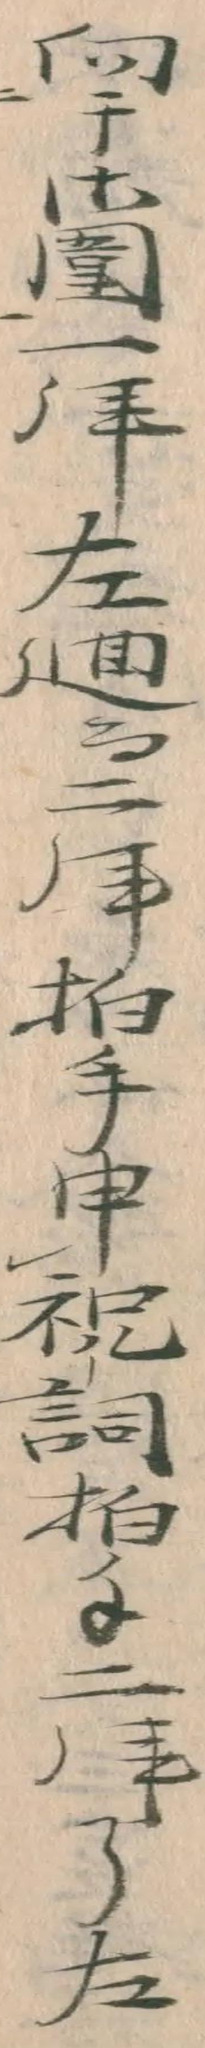向于御圍一拝左廻而二拝拍手申祝詞拍手二拝了左
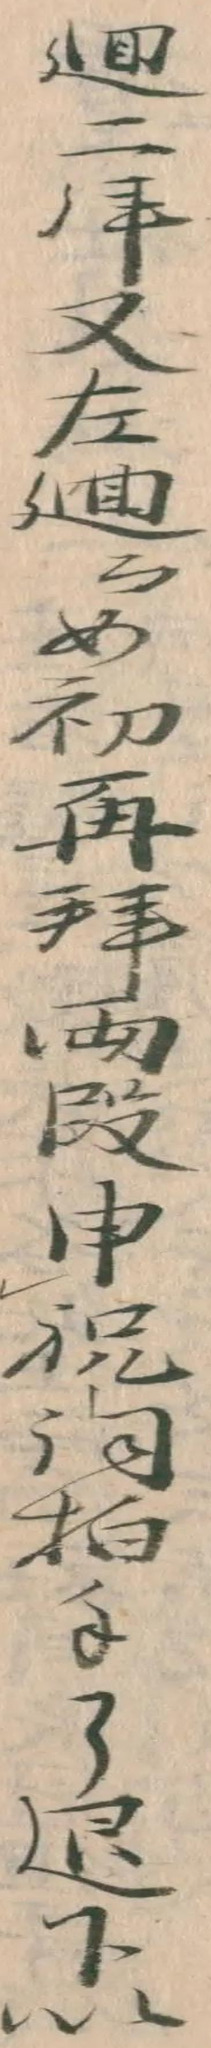廻二拝又左廻而如初再拝両段申祝詞拍手了退下以
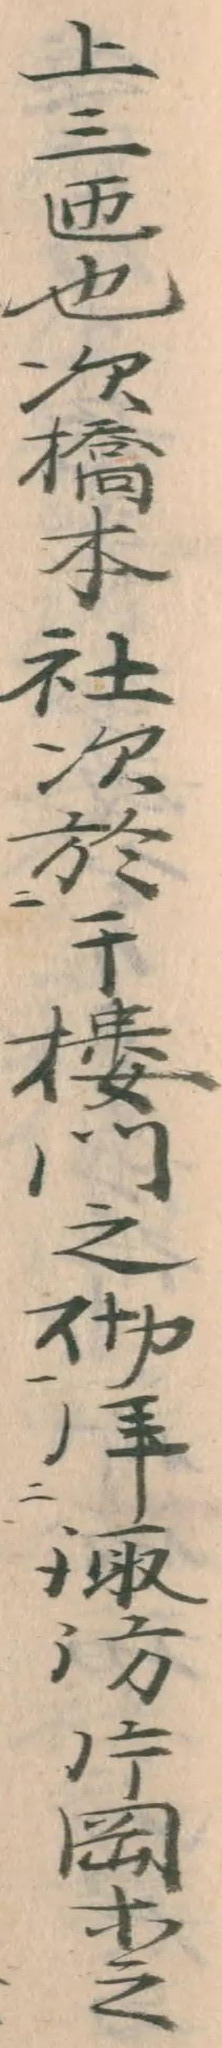上三匝也次橋本社次於于楼門之砌拝諏訪片岡等之
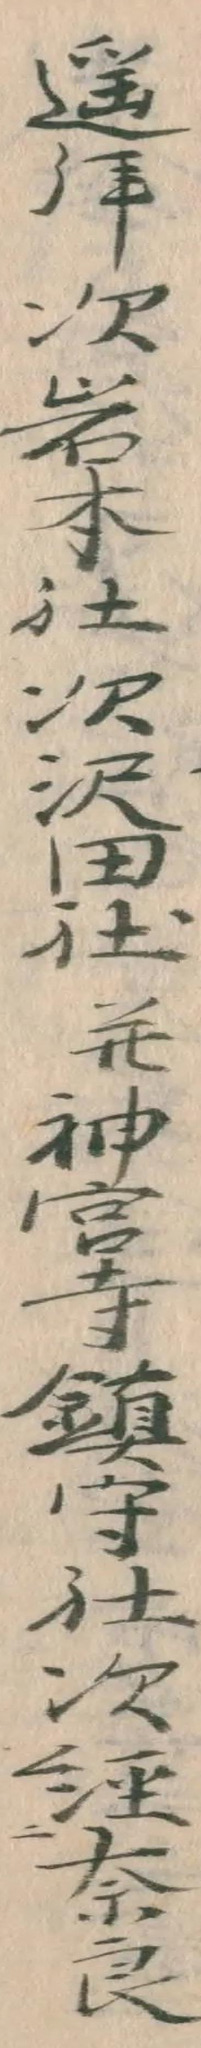遥拝次岩本社次沢田社并神宮寺鎮守社次経奈良
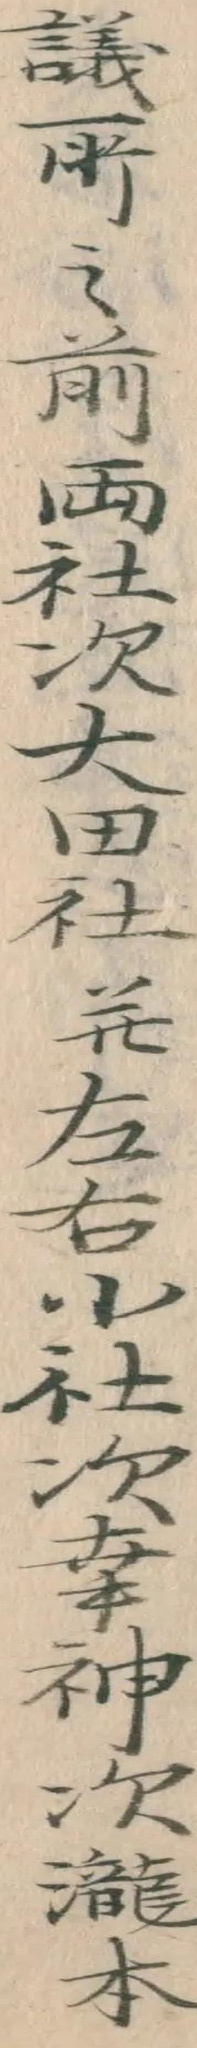議所之前両社次大田社并左右小社次幸神次瀧本
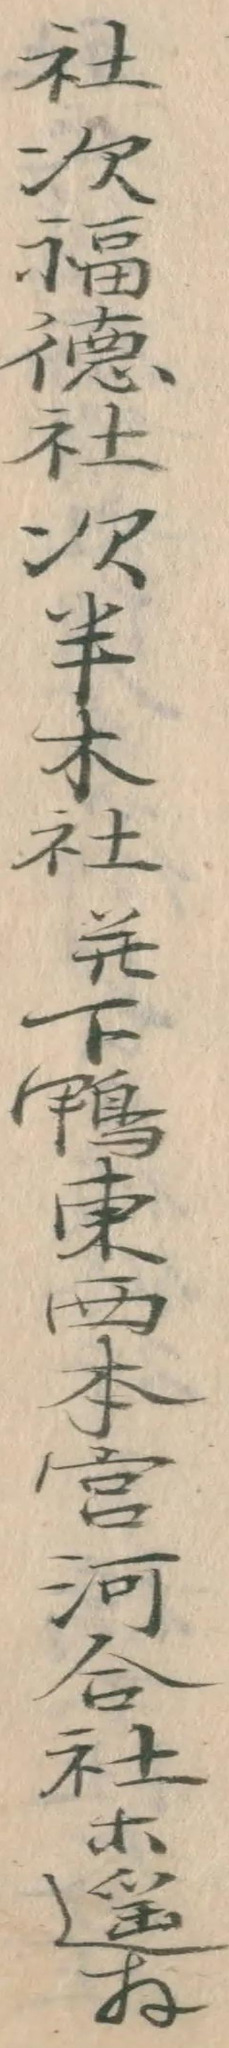社次福徳社次半木社并下鴨東西本宮河合社等遥拝
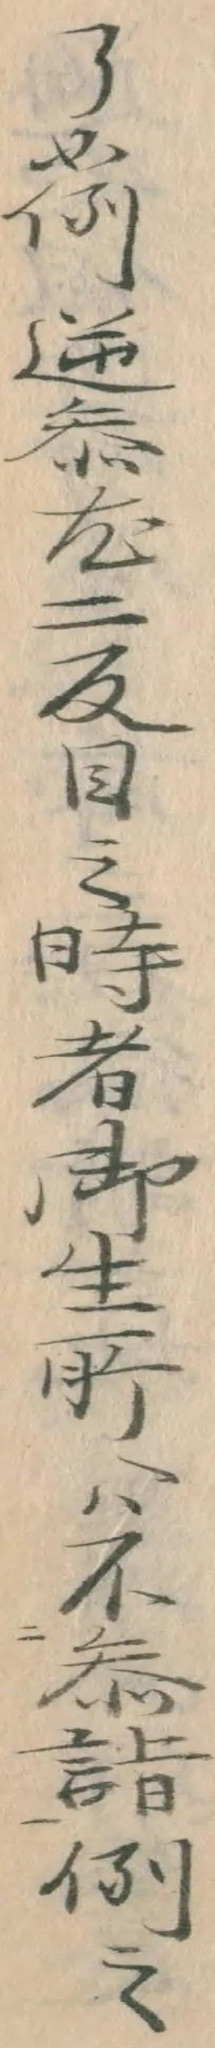了如例逆参尤二反目之時者御生所へは不参詣例之

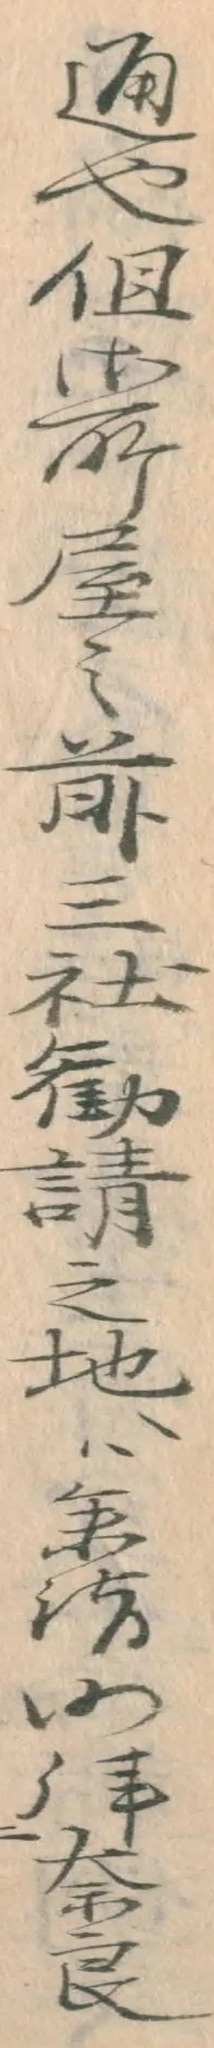通也但御所屋之前三社勧請之地ヘハ参詣仍拝奈良
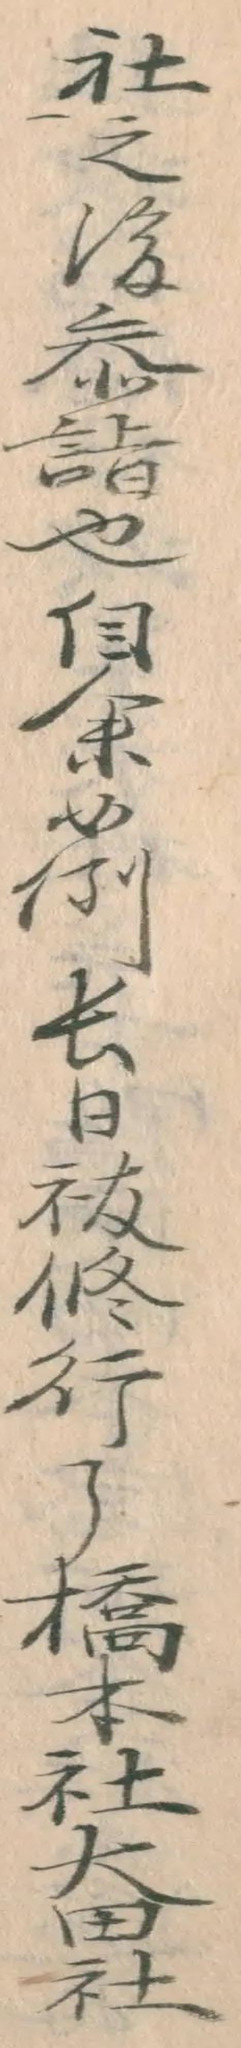社之後参詣也自余如例長日祓修行了橋本社大田社
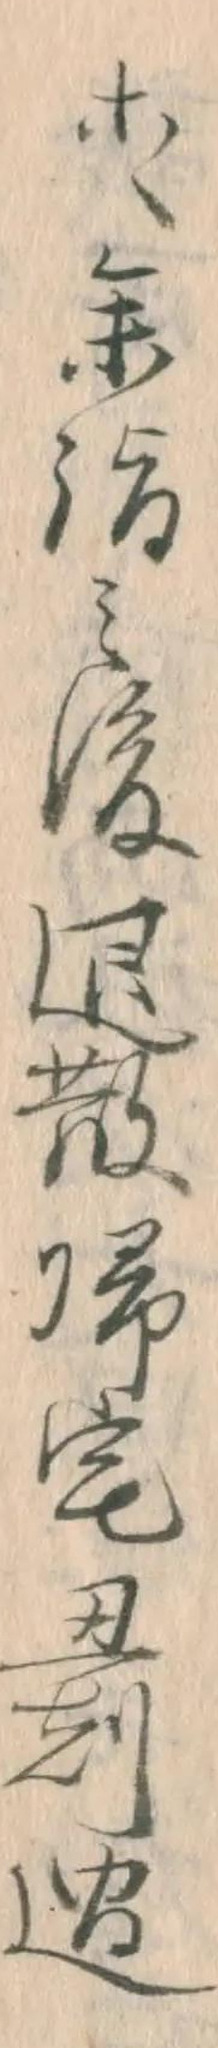等へ参詣之後退散帰宅丑刻過
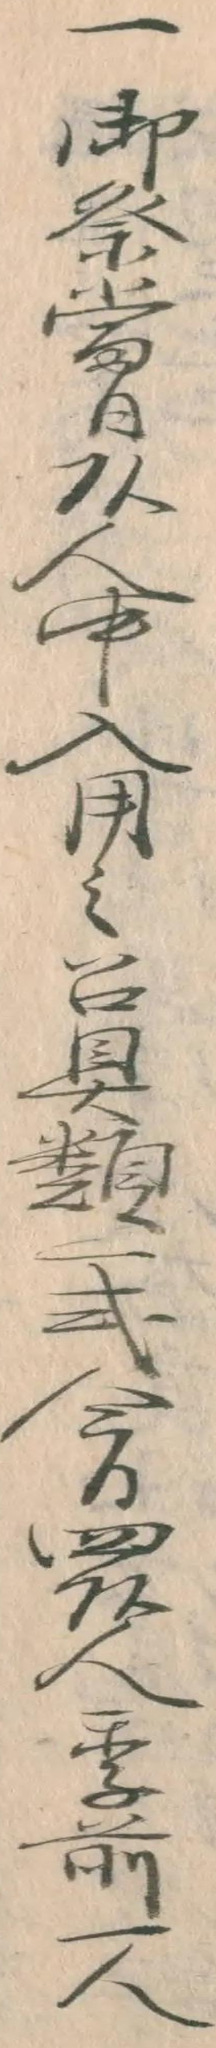一御祭當日頭人中入用之召具類一式今日四頭人季前一人
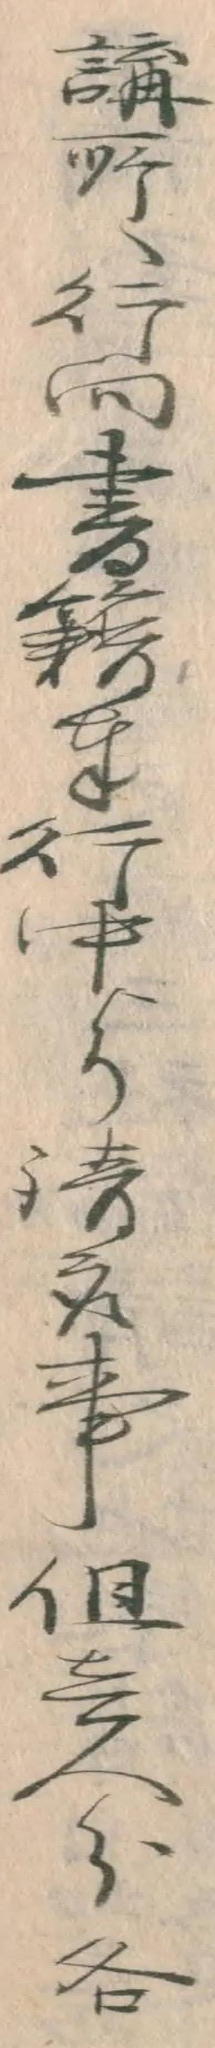講所へ行向書籍奉行中より請取事但壱人分各
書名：賀茂社記録. 第73冊
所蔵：国立国会図書館 National Diet Library, JAPAN
